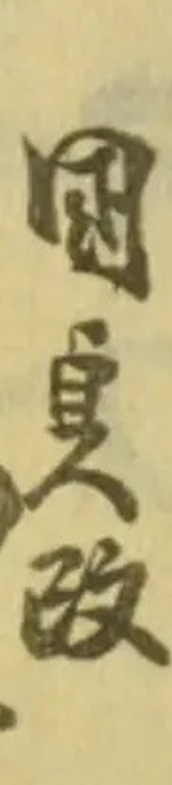国貞改
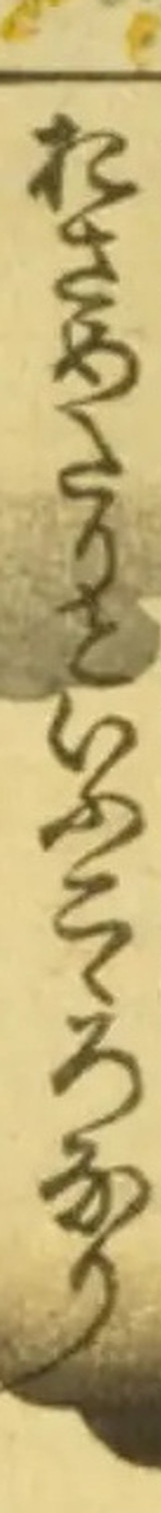おさめたりといふこゝろなり
